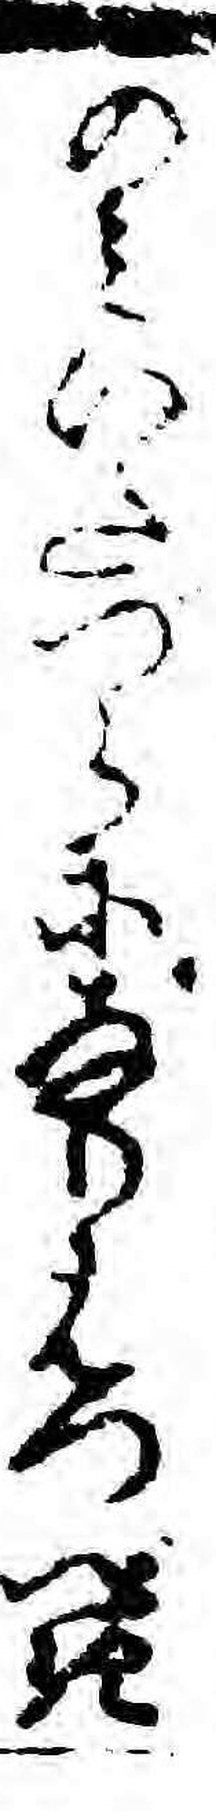のみいたづらになりはつべき
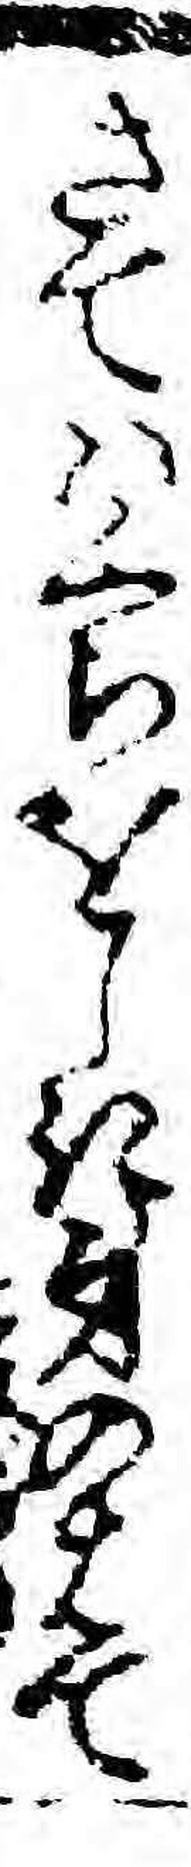きてはくちをしき身のはて
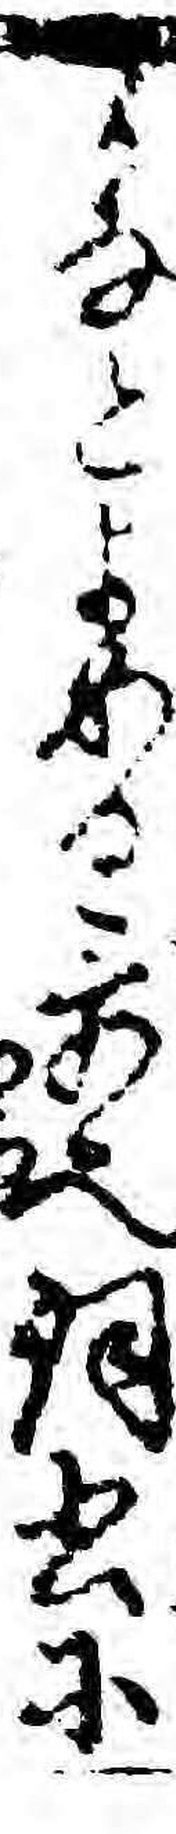かなとよめる哥也詞書に
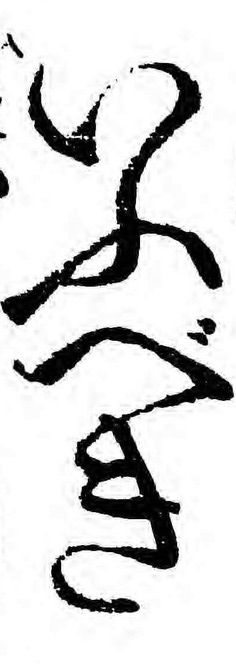いふべき
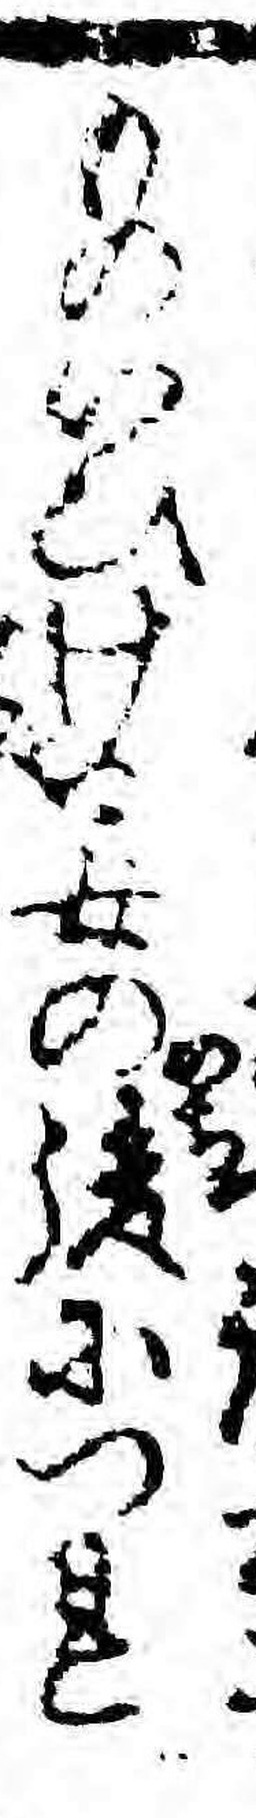ものいひける女の後につれ
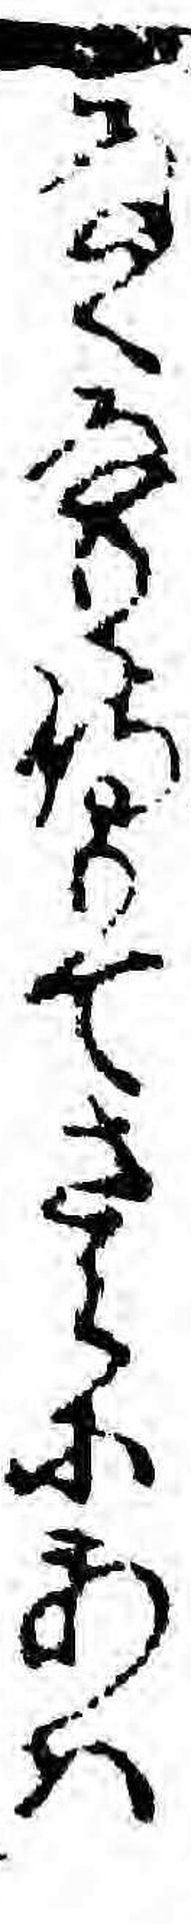なくなり侍りてさらにあは
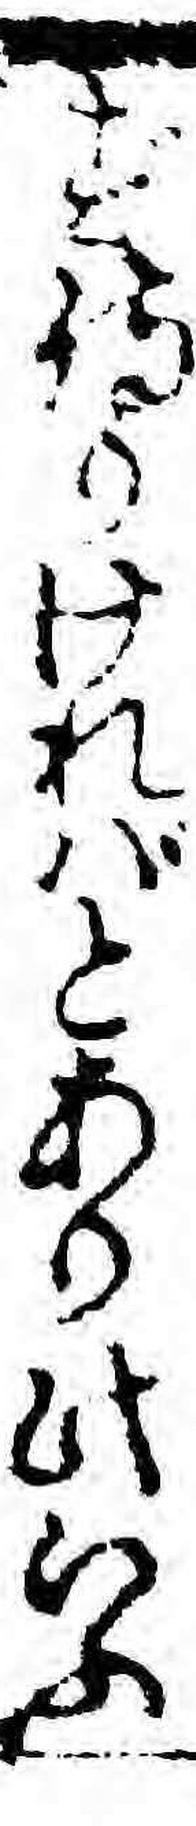ず侍りければとあり此いふ
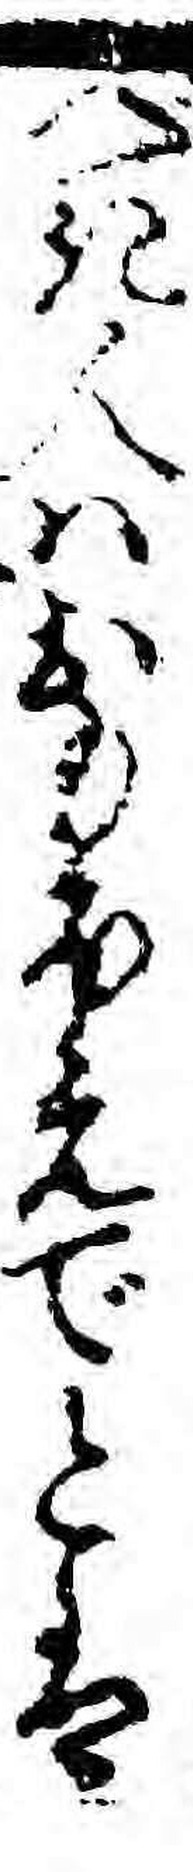べき人はおもほえでとは
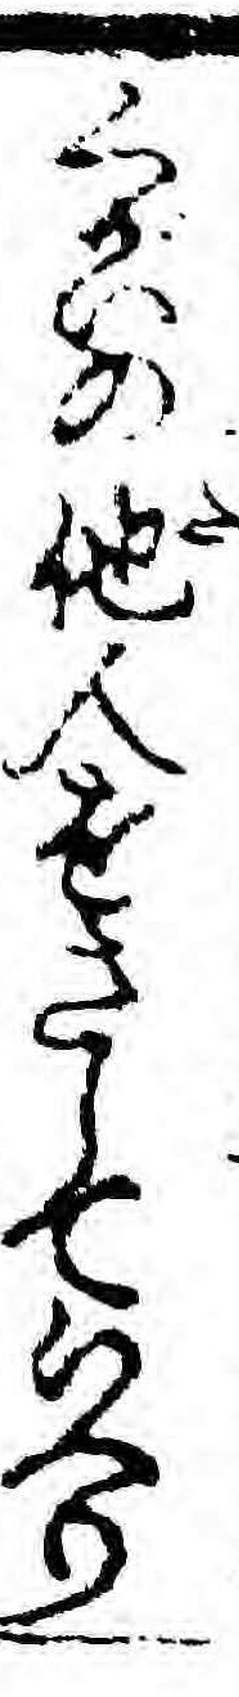たがいの他人をさしていへり
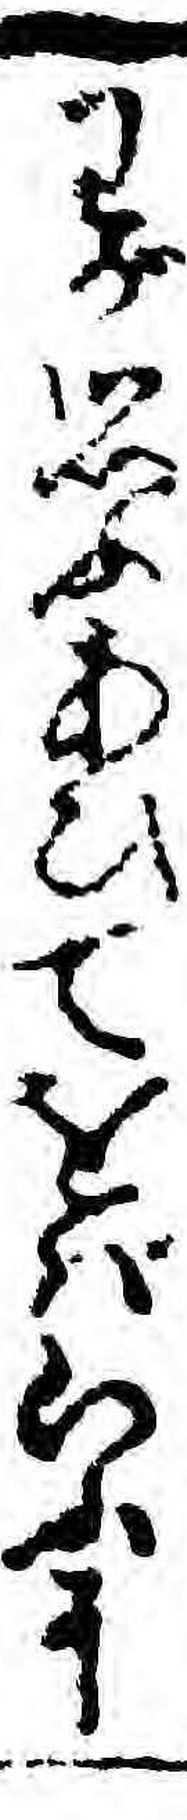わが思ふあひてをばいかに
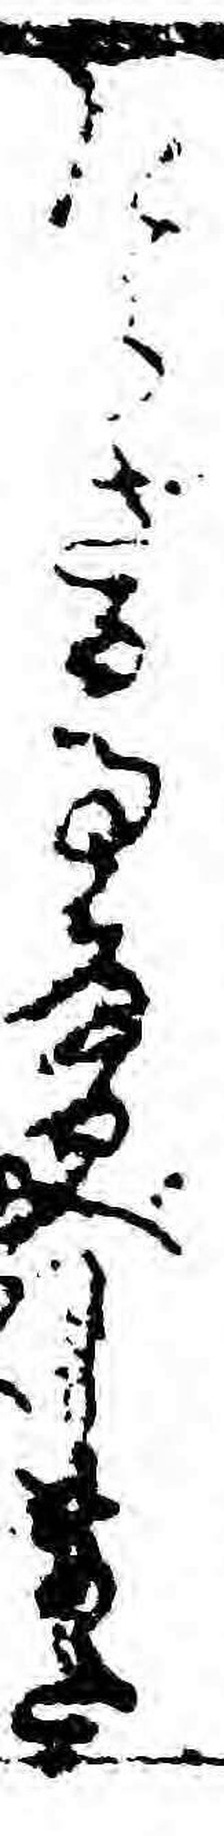たらざる事なるべしまた
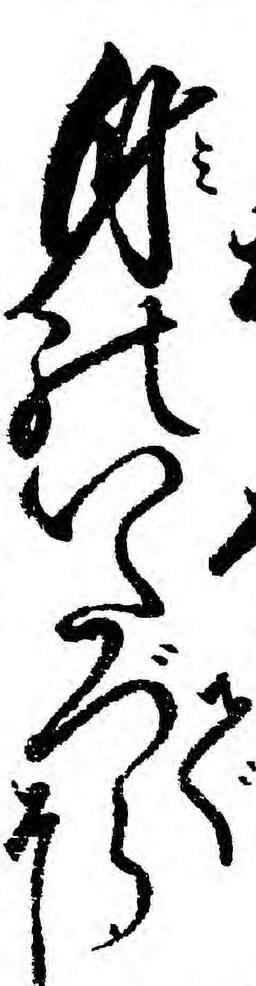身のいたづらに
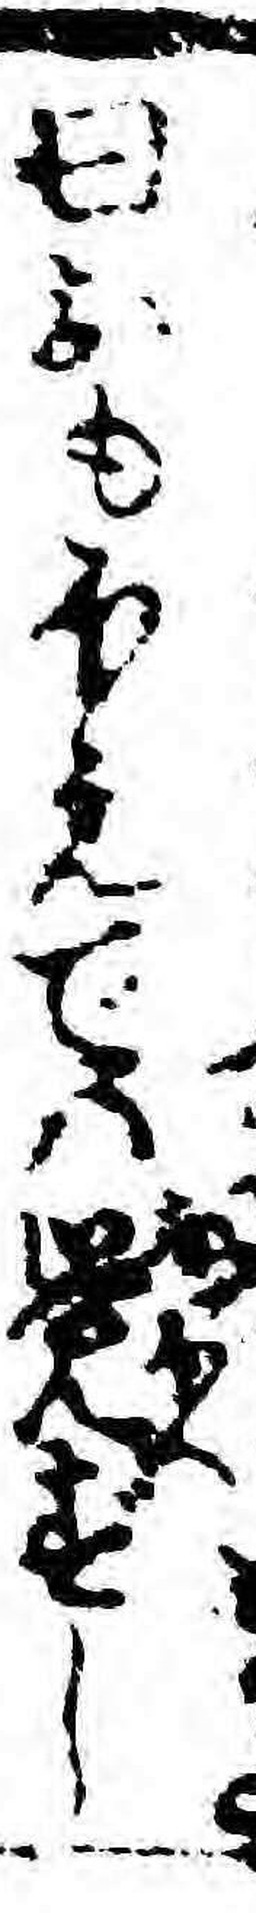曰おもほえでは覚ずし
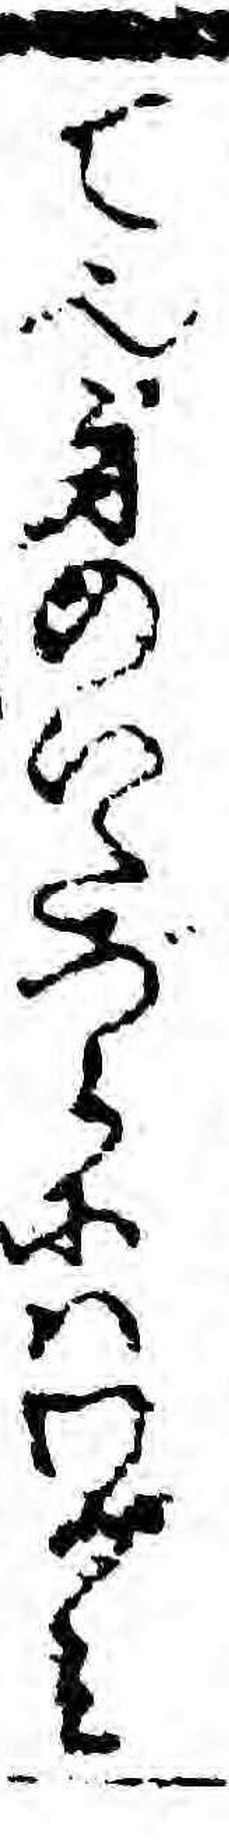て也身のいたづらにはわがみ
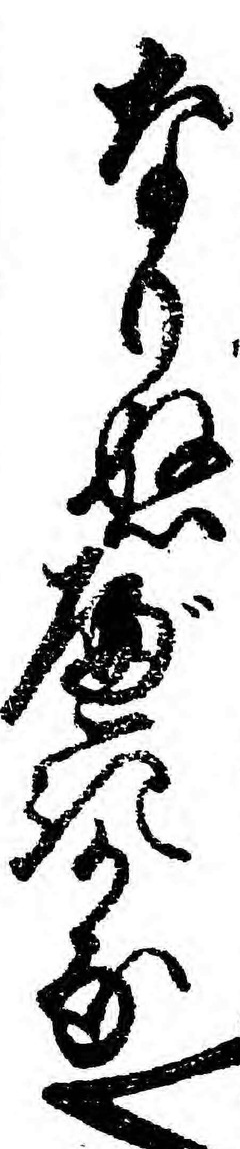なりぬべきかな

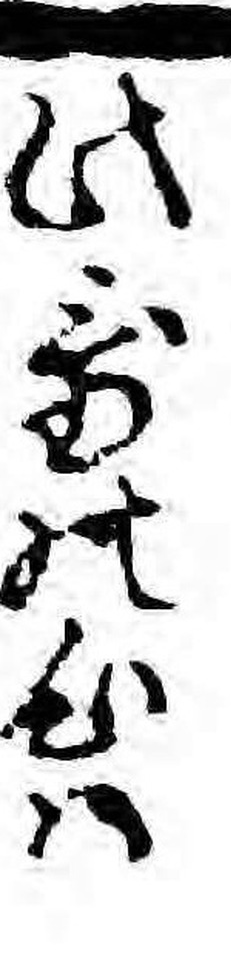此哥の心は
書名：頭書和歌注譯／壽賀多百人一首小倉錦
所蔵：国文学研究資料館
